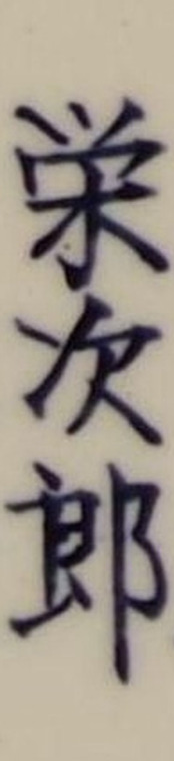栄次郎

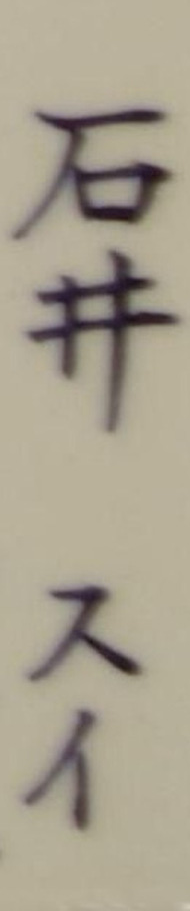石井スイ
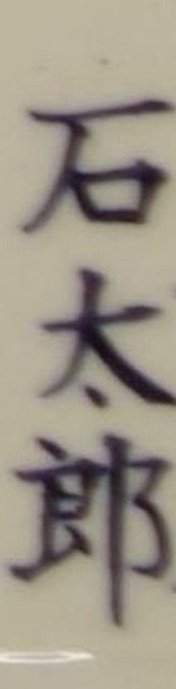石太郎
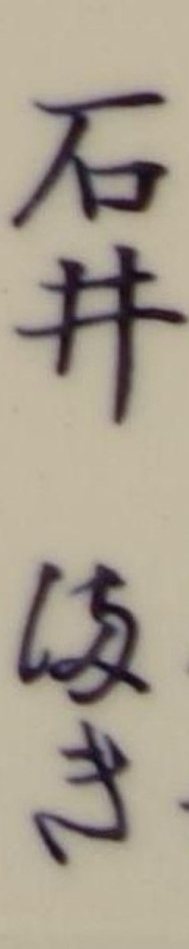石井まき

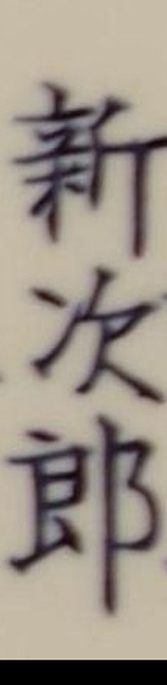新次郎
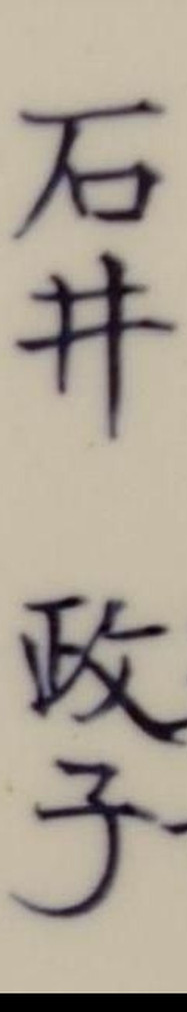石井政子
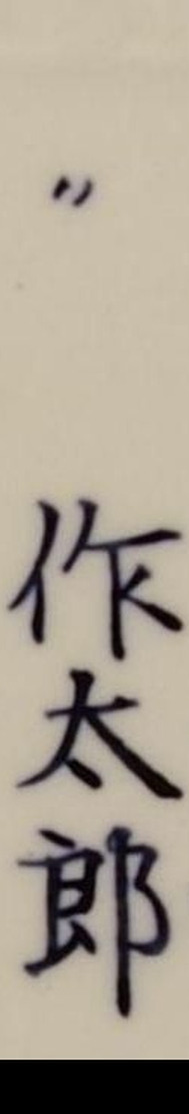作太郎
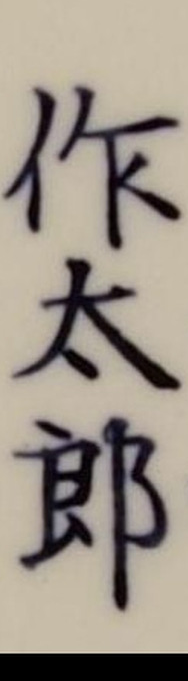作太郎
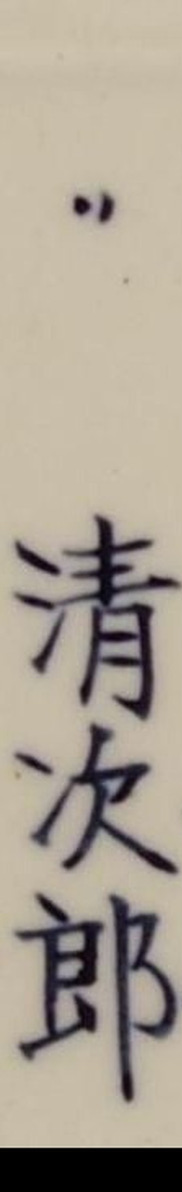清次郎
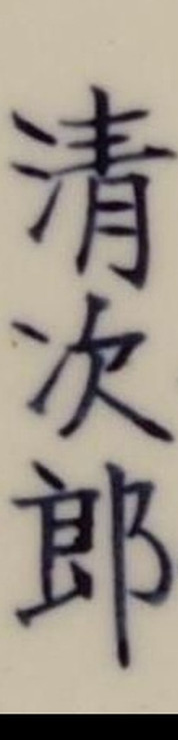清次郎
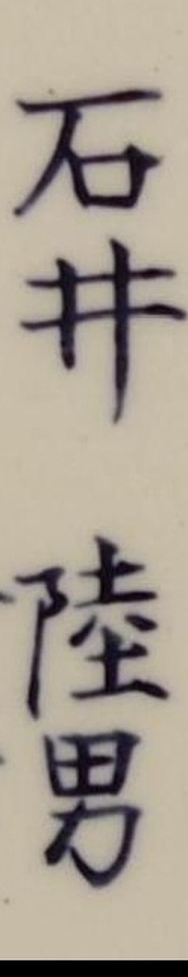石井陸男

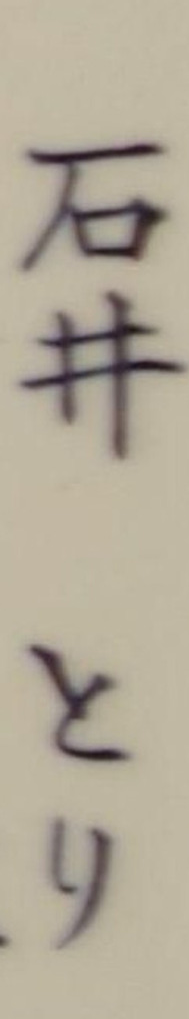石井とり
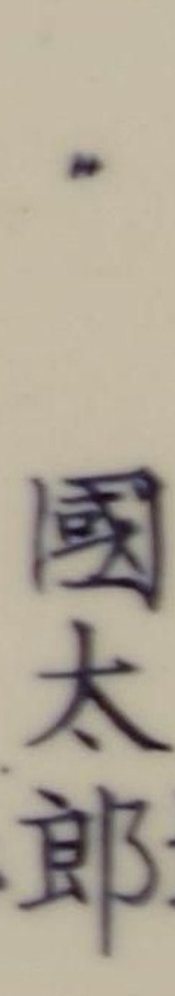國太郎
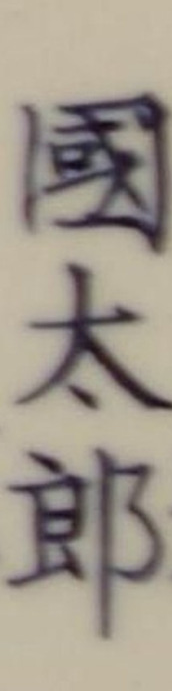國太郎
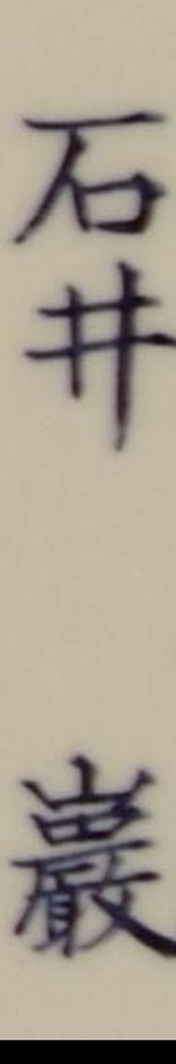石井巌
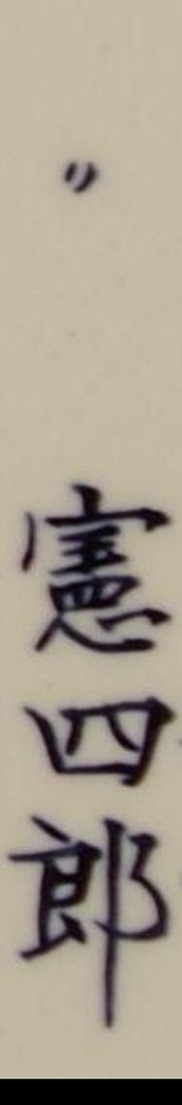憲四郎
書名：M~S
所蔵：高野山金剛峯寺
